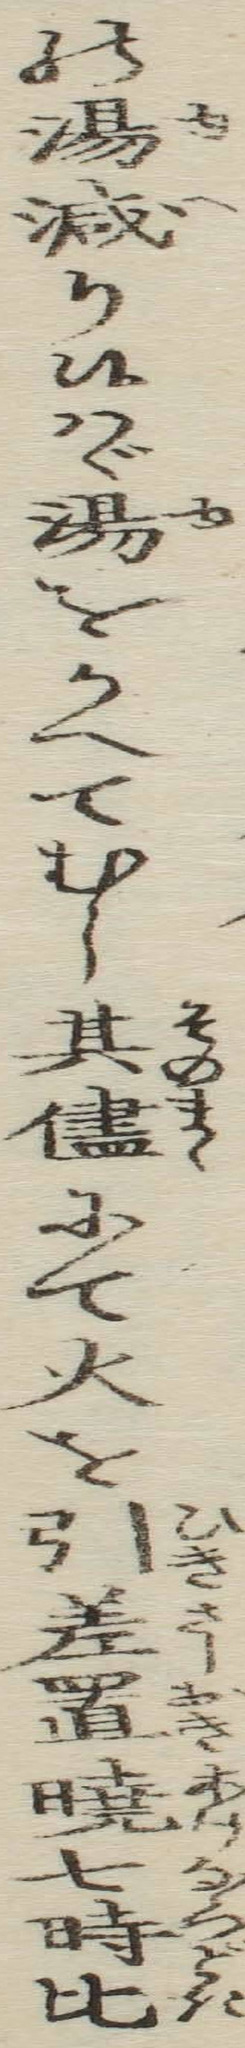の湯減り候はゞ湯をかへてむし其儘にて火を引差置暁七時比

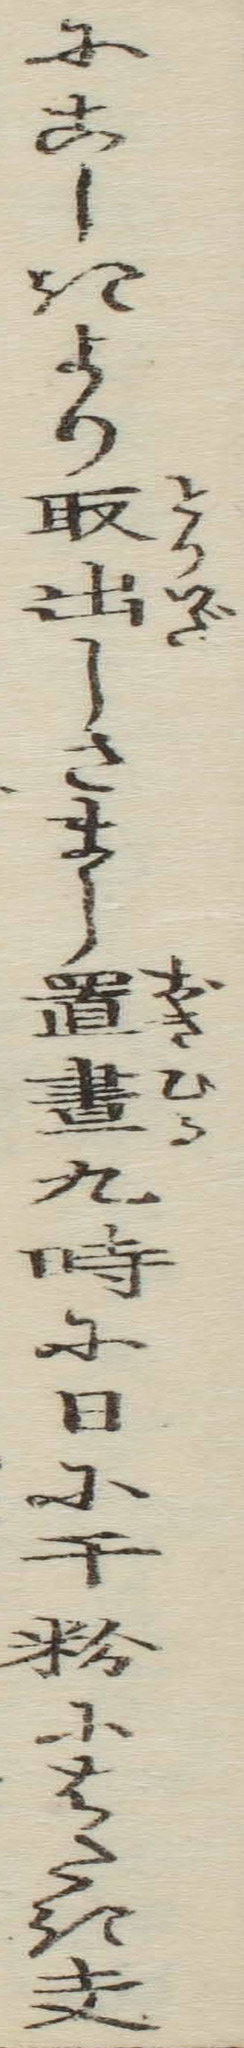にこしきより取出しさまし置昼九時に日に干粉にはたき夫
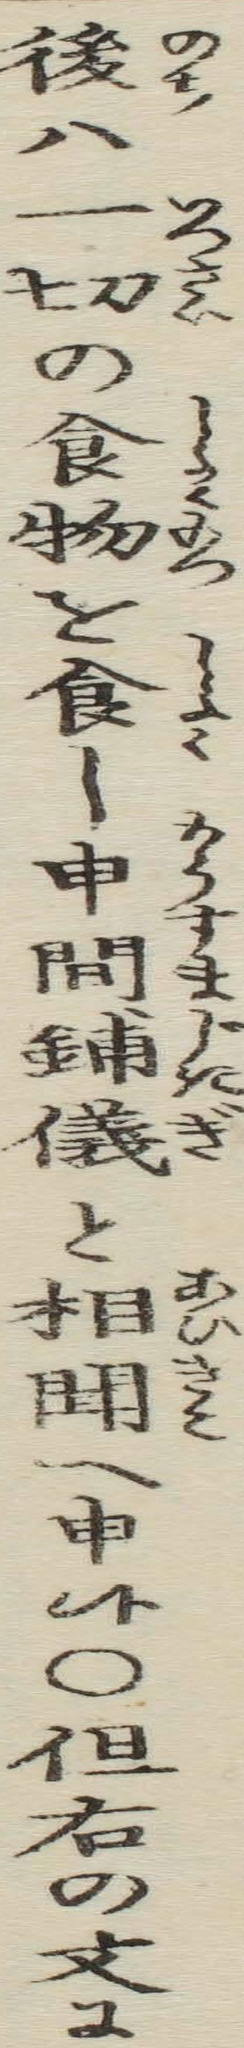後は一切の食物を食し申間鋪儀と相聞へ申候○但右の文に
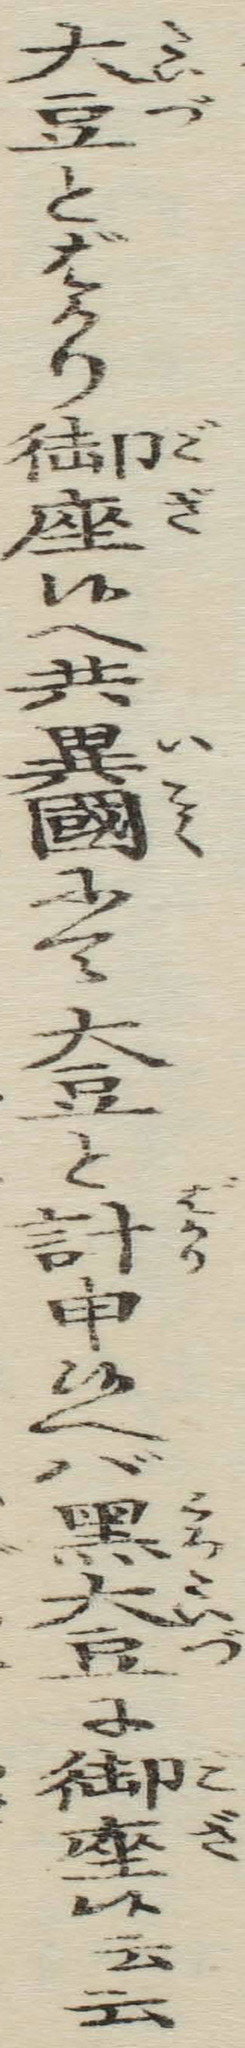大豆とばかり御座候へ共異国にて大豆と計申候へば黒大豆に御座候云云
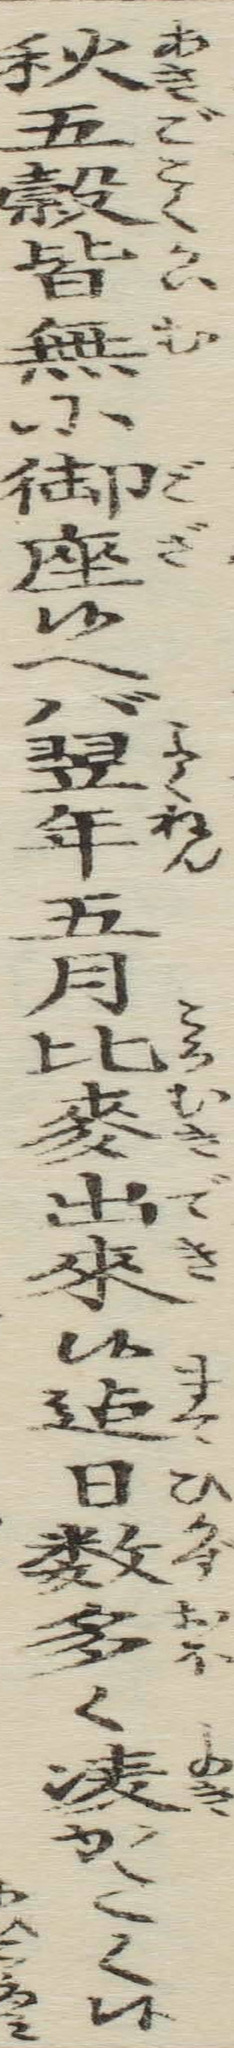秋五穀皆無に御座候へば翌年五月比麦出来候迄日数多く凌かたく候
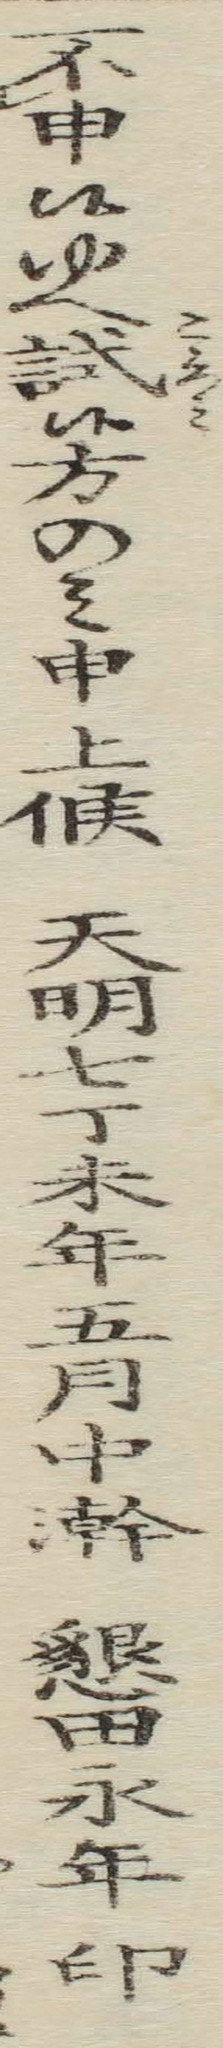不申候ゆへ試候方のみ申上候天明七丁未年五月中澣墾田永年印
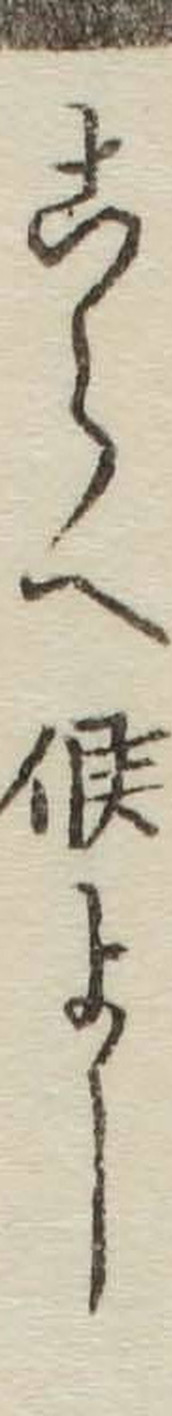こらへ候よし
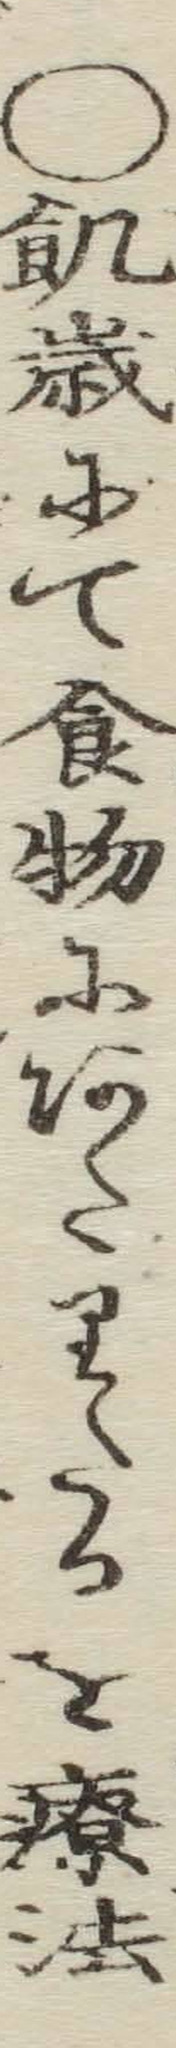○飢歳にて食物にあたりたるを療法
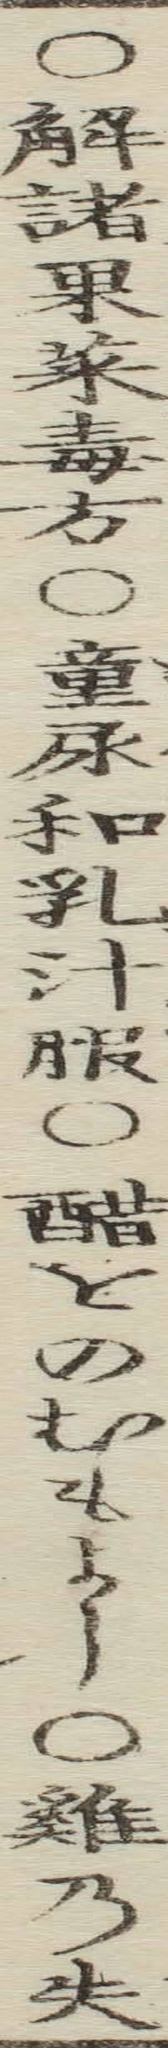○解諸果菜毒方○童尿和乳汁服○醋をのむもよし○鶏の失
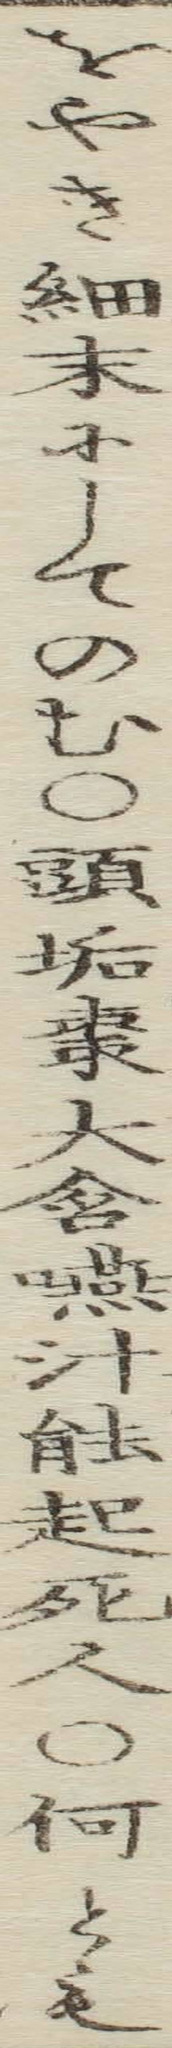をやき細末にしてのむ○頭垢棗大含嚥汁能起死人○何とも
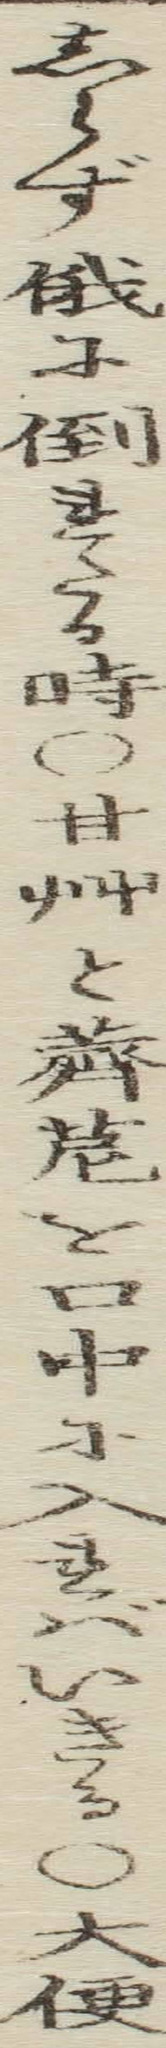しらず俄に倒れたる時○甘艸と薺苨を口中に入ればいきる○大便
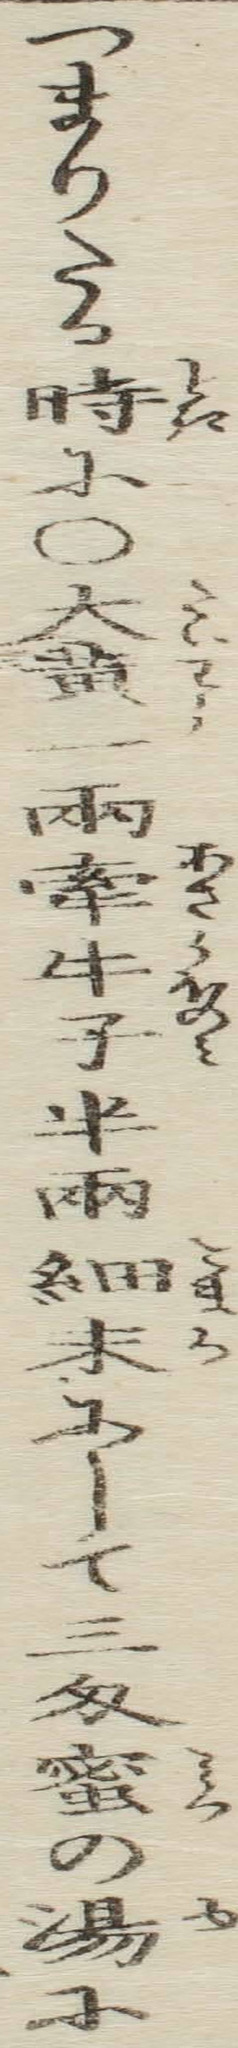つまりたる時に○大黄一両牽牛子半両細末にして三匁蜜の湯に
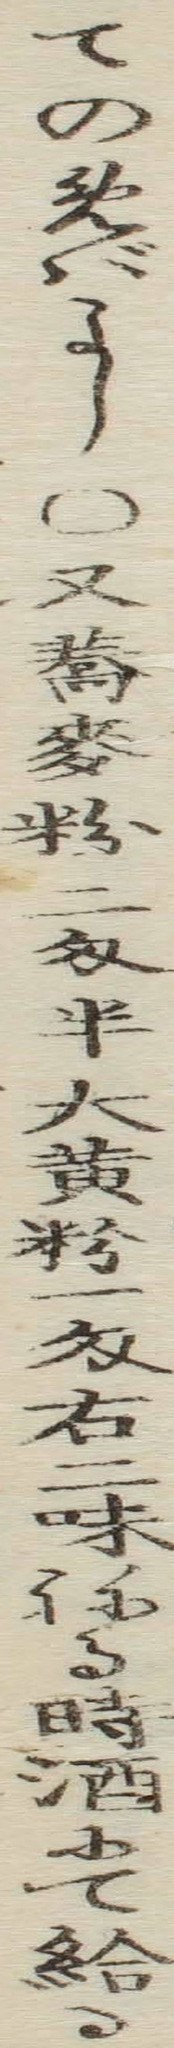てのめばよし○又蕎麦粉二匁半大黄粉一匁右二味ねる時酒にて給る

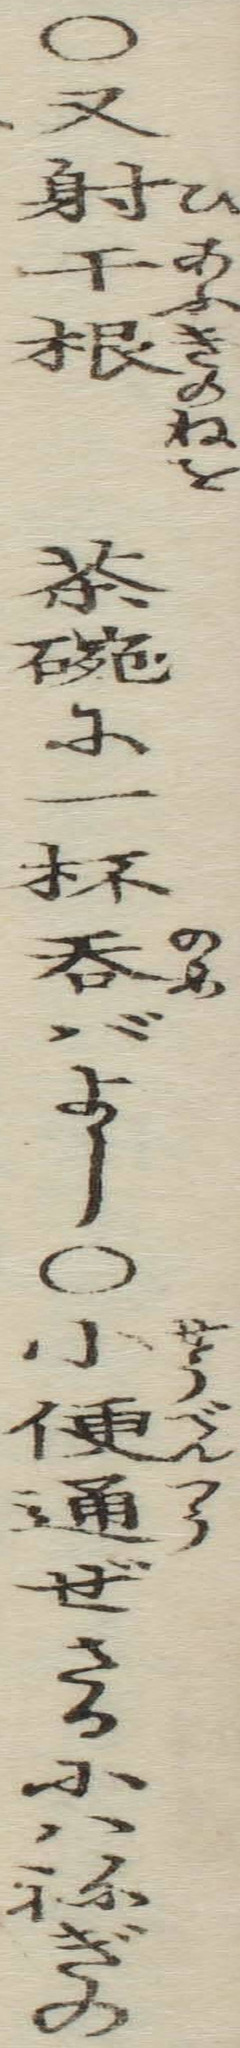○又射干根茶碗に一杯呑ばよし○小便通ぜさるにはねぎの
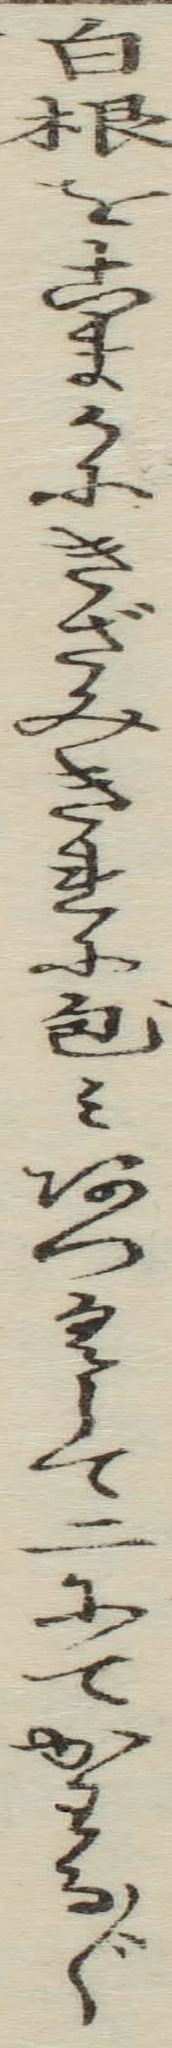白根をこまかにきざみきれに包みあつくして二にてかわる〴〵
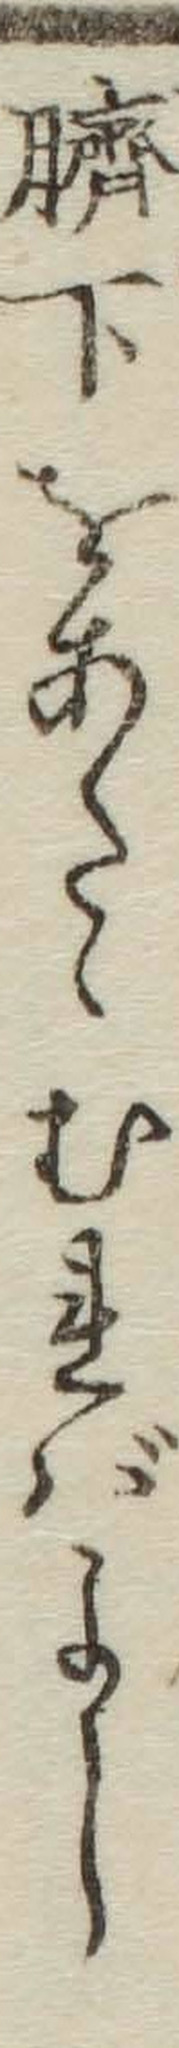臍下をあたゝむればよし
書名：救荒便覧
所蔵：国文学研究資料館
